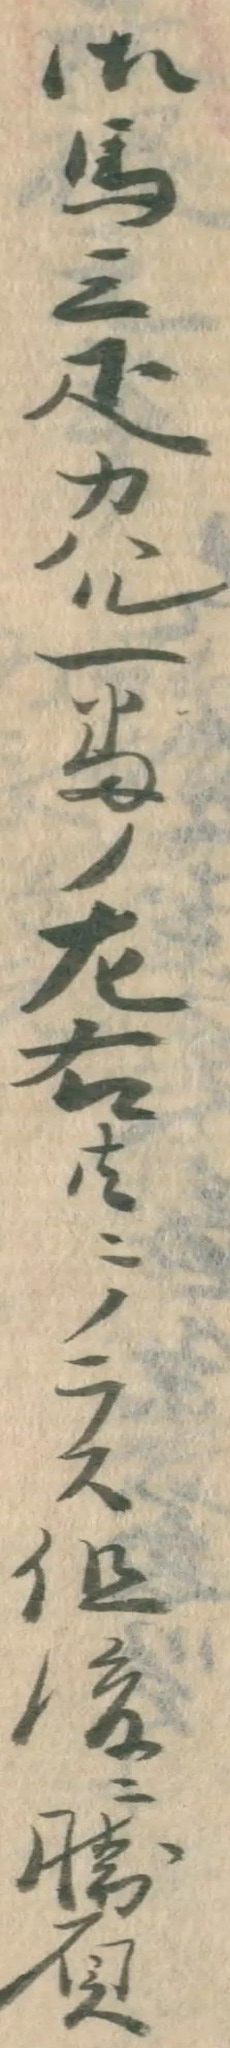御馬三疋カハル一番ノ左右共ニノラス但後ニ勝負
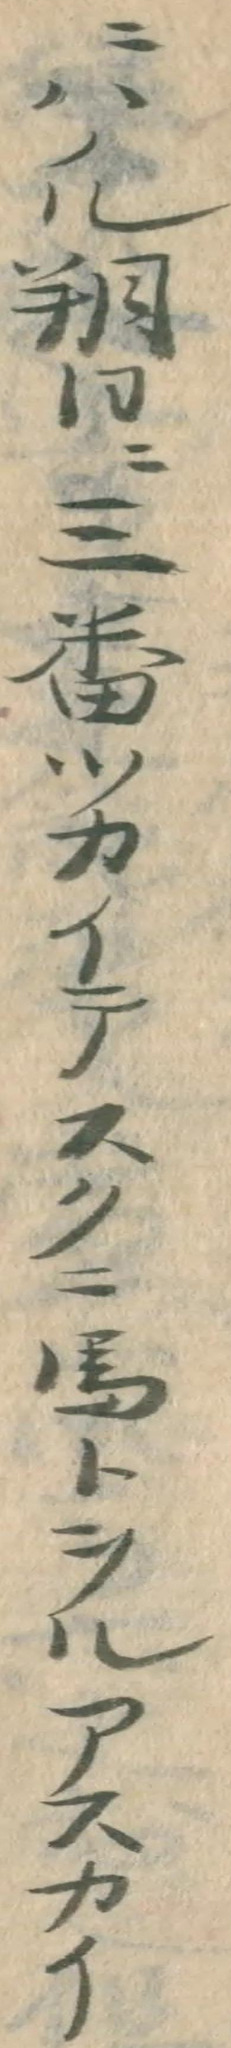ニハノル朔日ニ三番ツカイテスクニ馬トヲルアスカイ
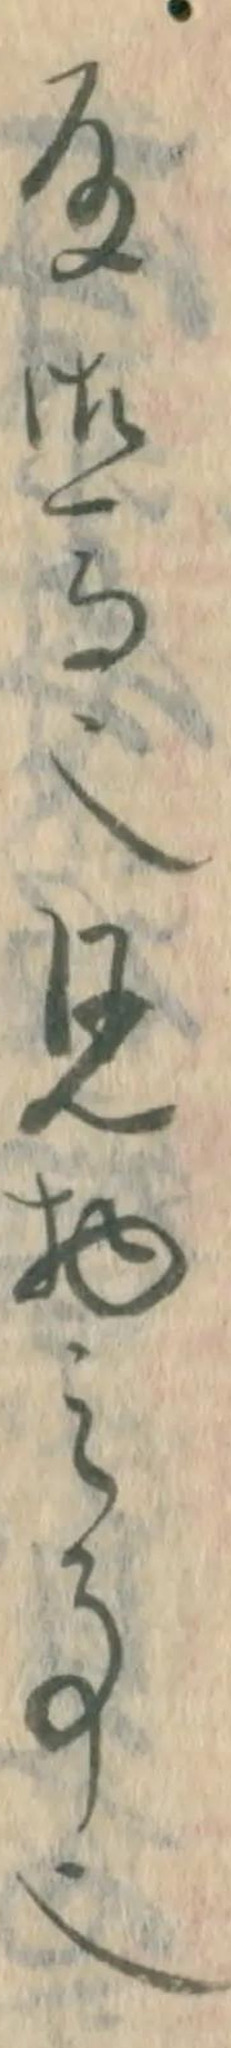殿御馬也見物之事也
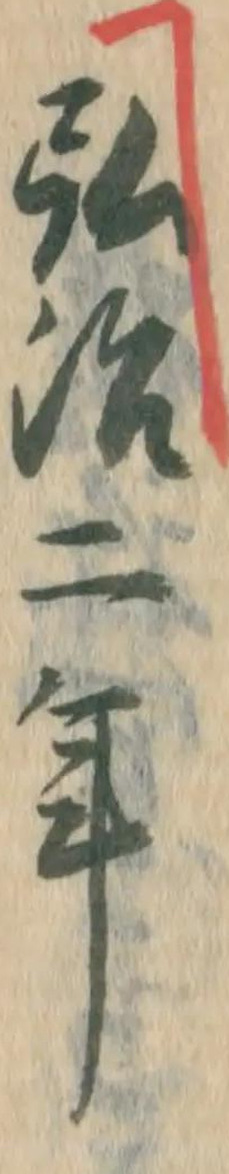弘治二年

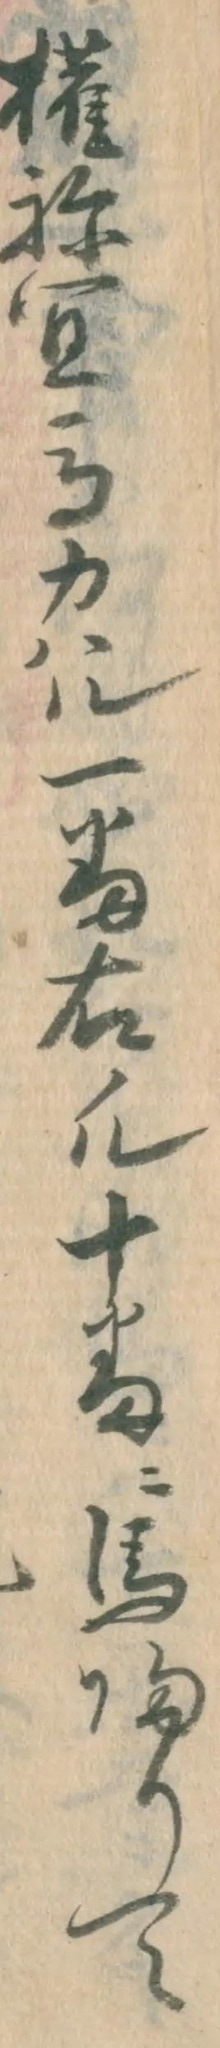権祢宜馬カハル一番右ノル十番二馬帰りて
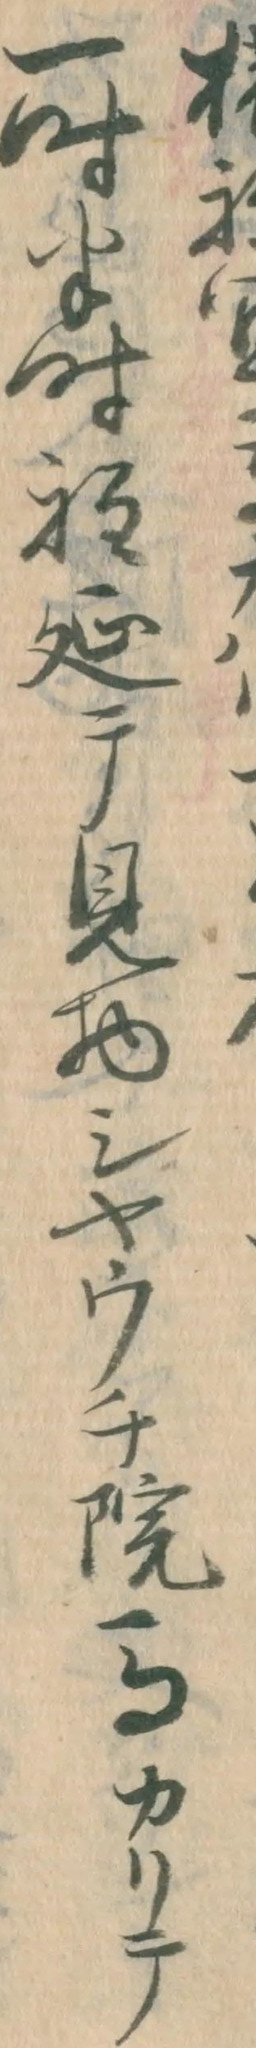一時半時程延テ見物シヤウチ院馬カリテ
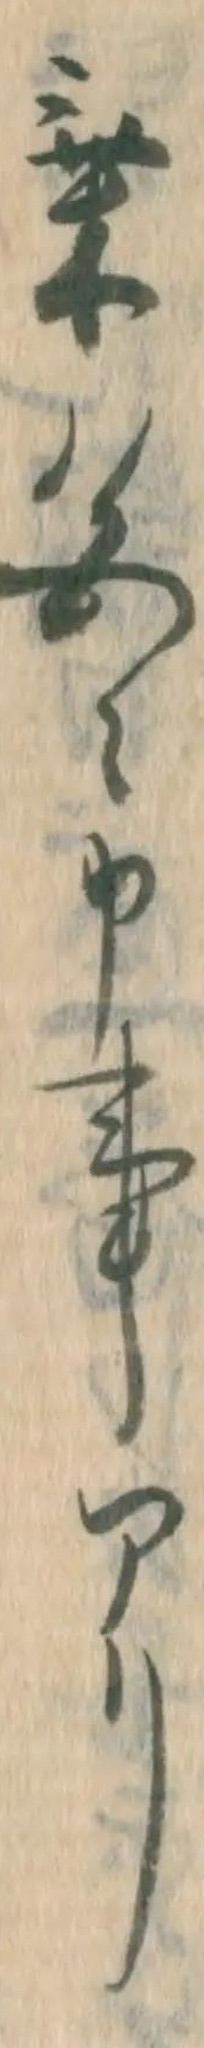乗色々申事アリ
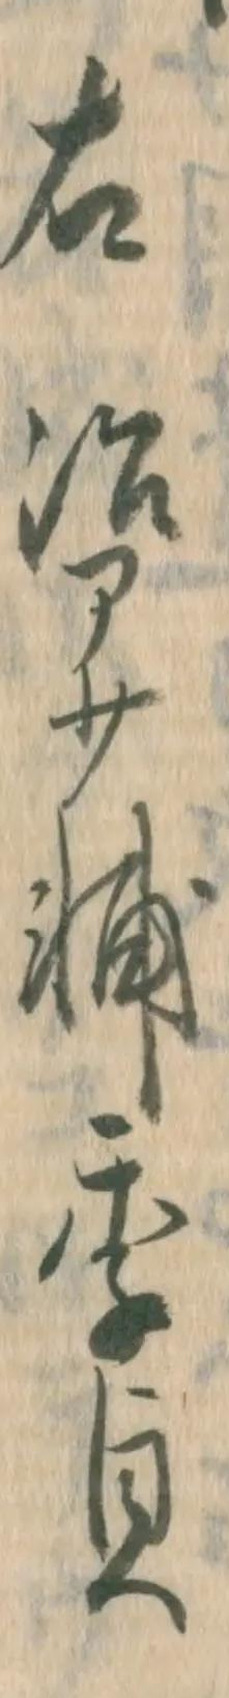右治部少輔季貞
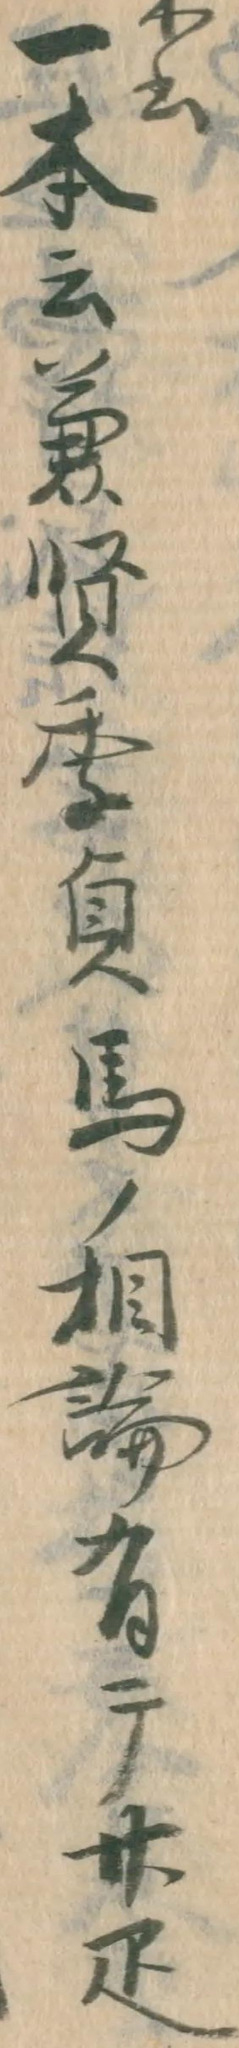一本云兼賢季貞馬ノ相論有テ廿疋
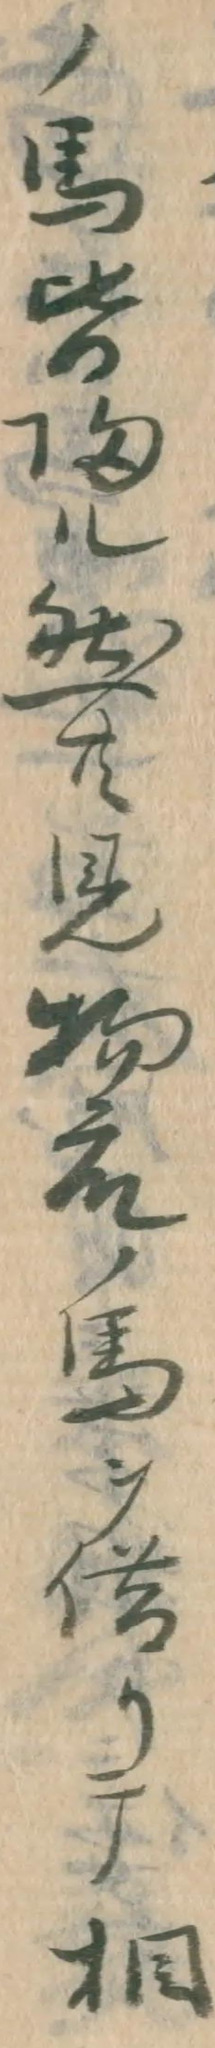ノ馬皆帰ル然共見物衆ノ馬ヲ借リテ相
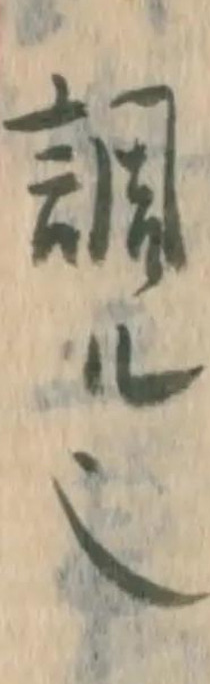調ル也
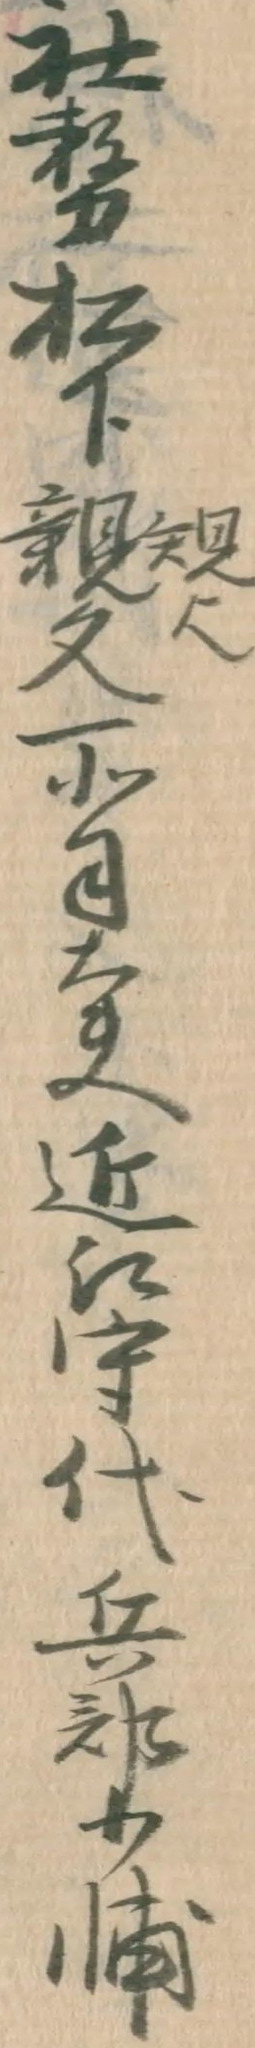社務松下親久所司大夫近江守代兵部少輔
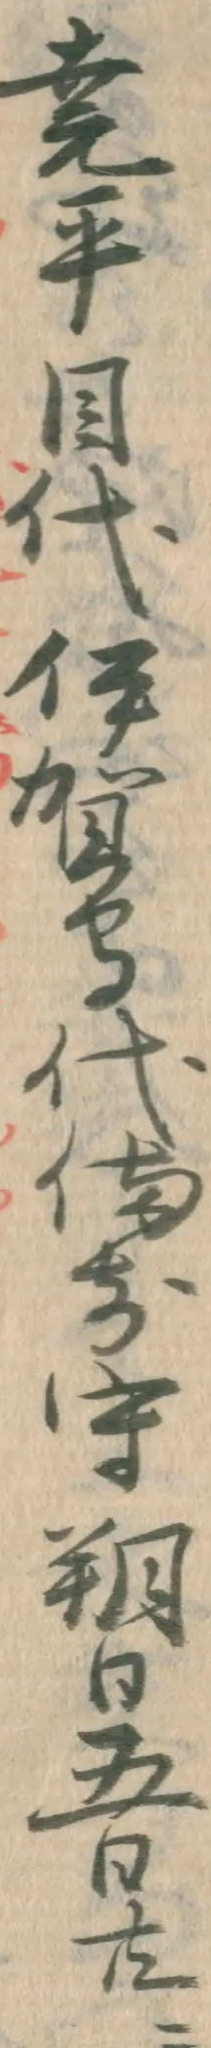堯平目代伊賀守代備前守朔日五日共ニ
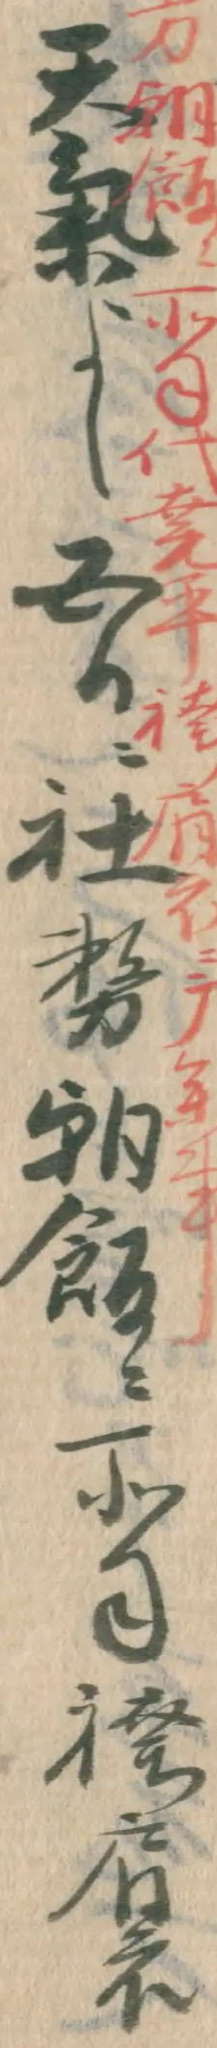天気よし五日ニ社務朝飯ニ所司袴肩不
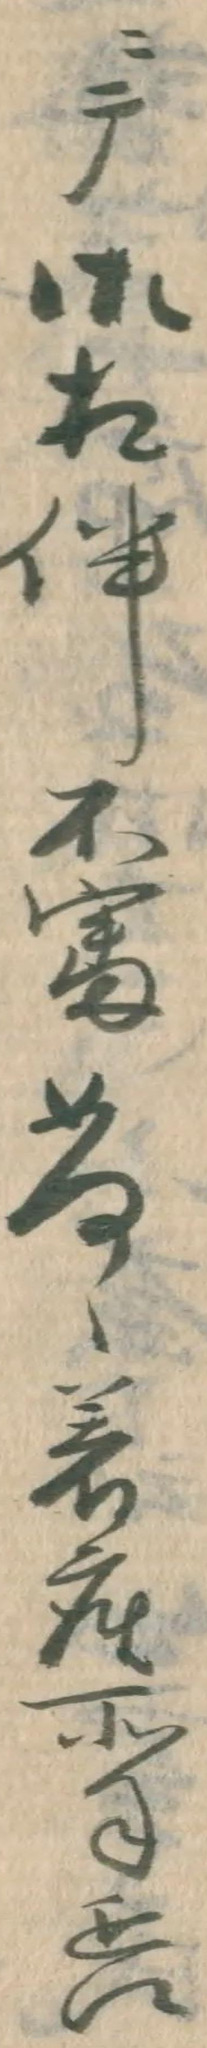ニテ御相伴不審如何候着座所司近江
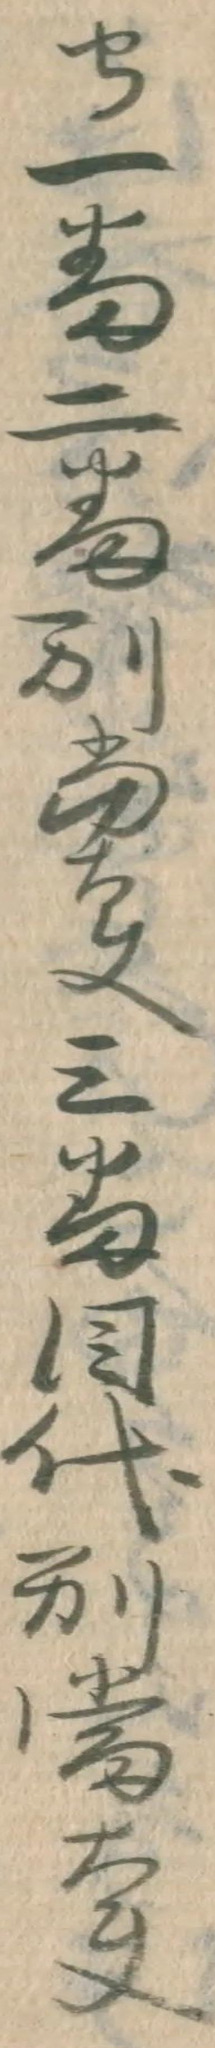守一番二番別当大夫三番目代別当大夫
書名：賀茂社記録. 第10冊
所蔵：国立国会図書館 National Diet Library, JAPAN
